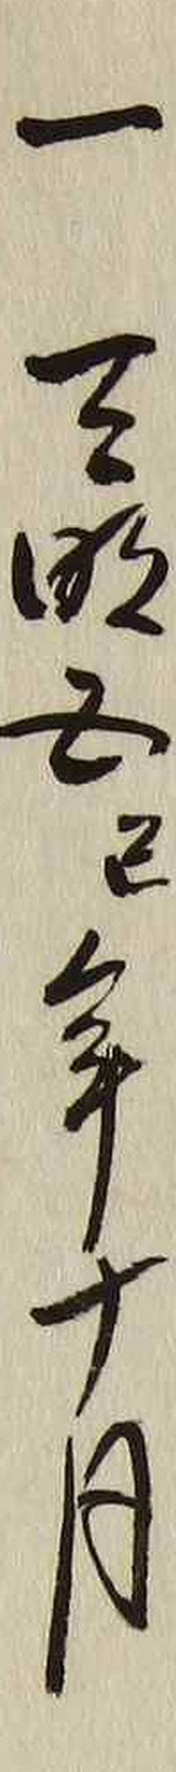一天明五巳年十月
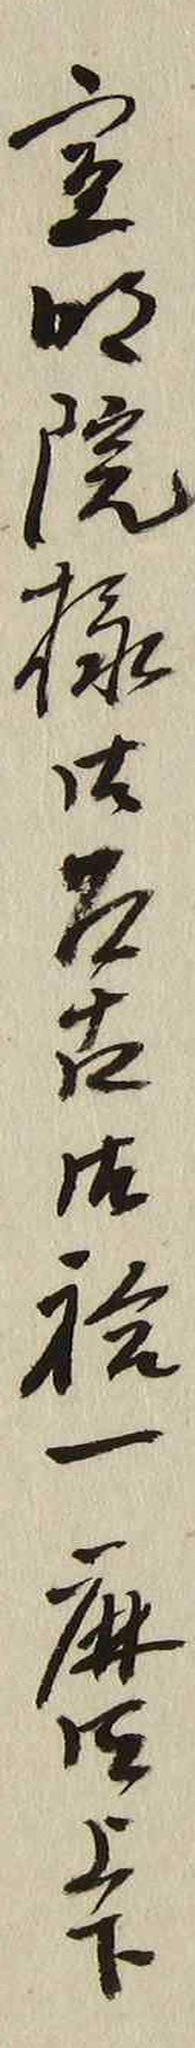宣明院様御召古御袷一麻御上下
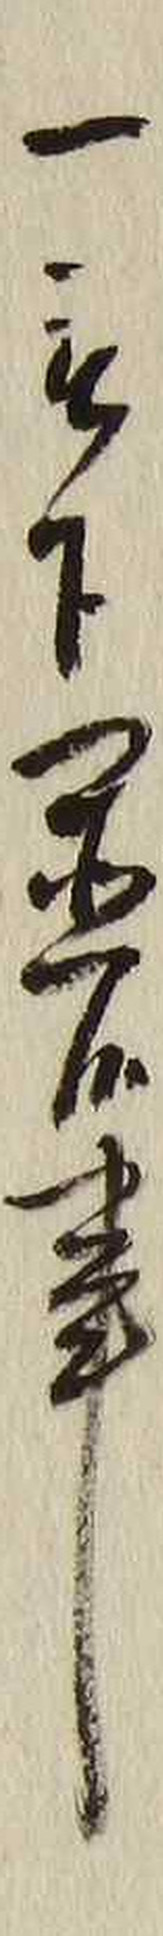一被下置候事
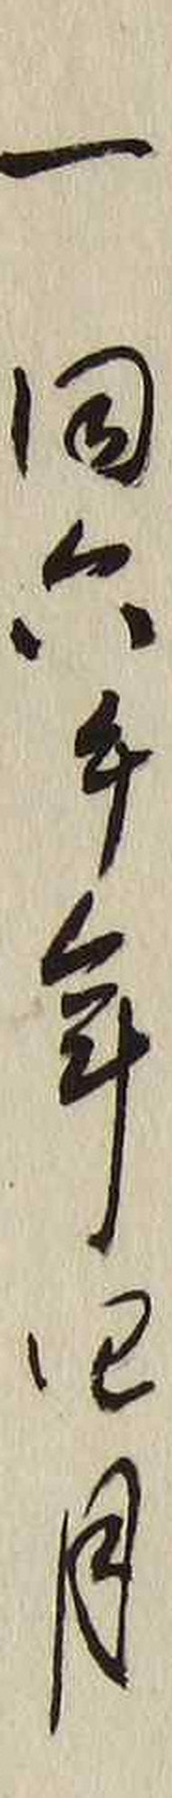一同六午年四月
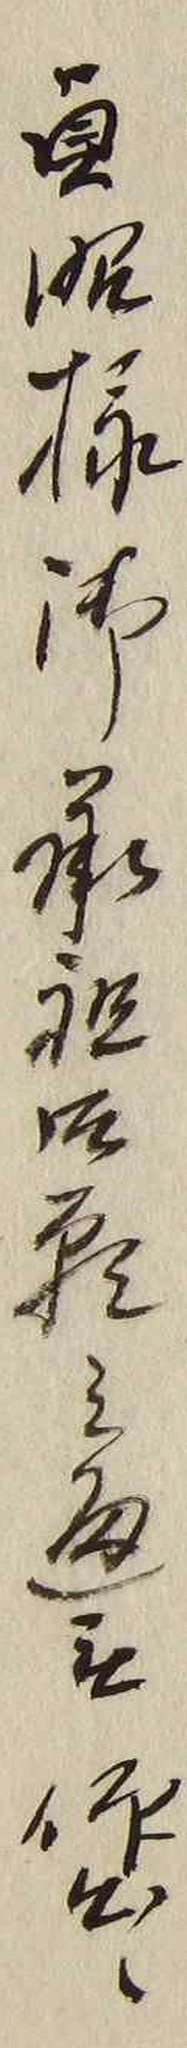貞昭様御承祖御願之通被仰出候

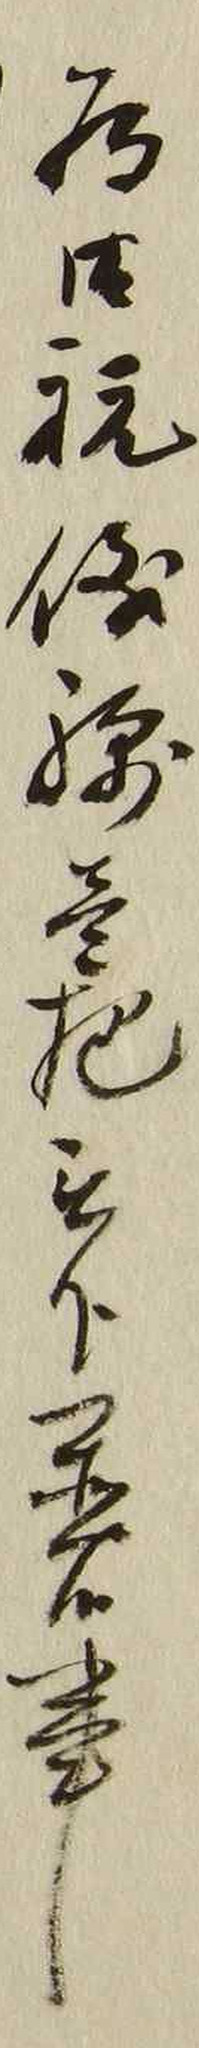為御祝儀綿壱把被下置候事
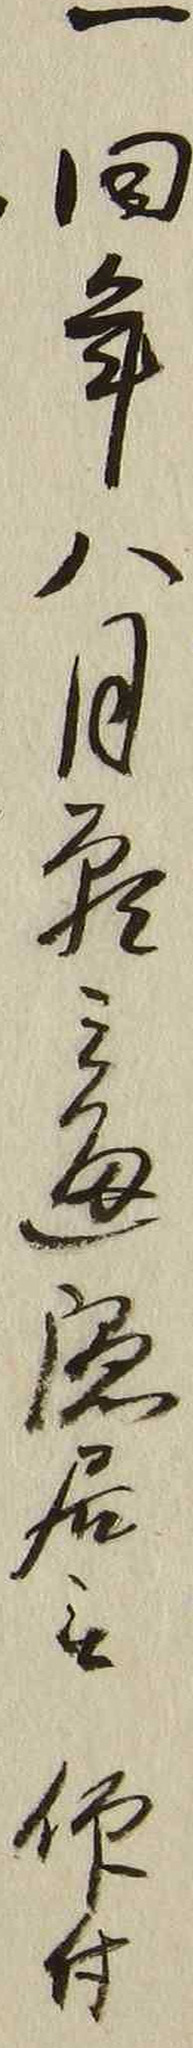一同年八月願之通隠居被仰付
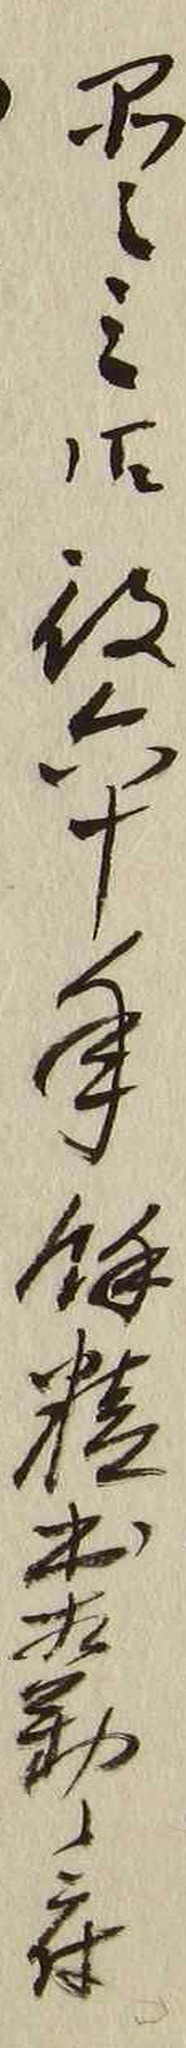品々之御役六十年余精出相勤候ニ付
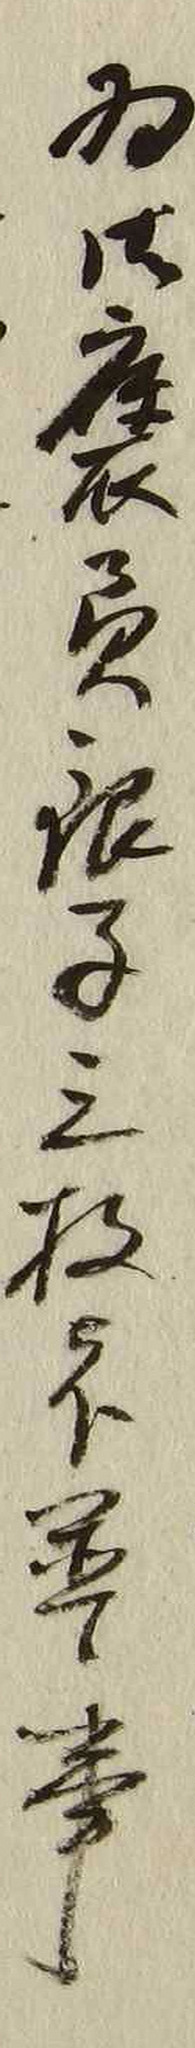為御褒美銀子三枚被下置候事
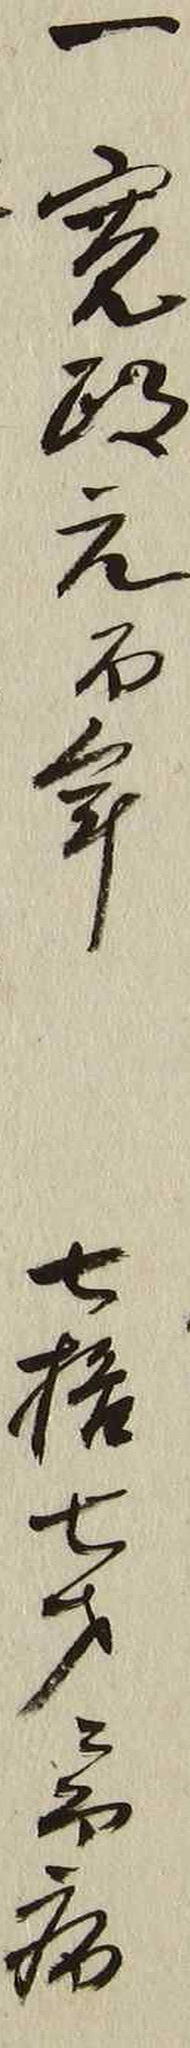一寛政元酉年七拾七才ニ而病
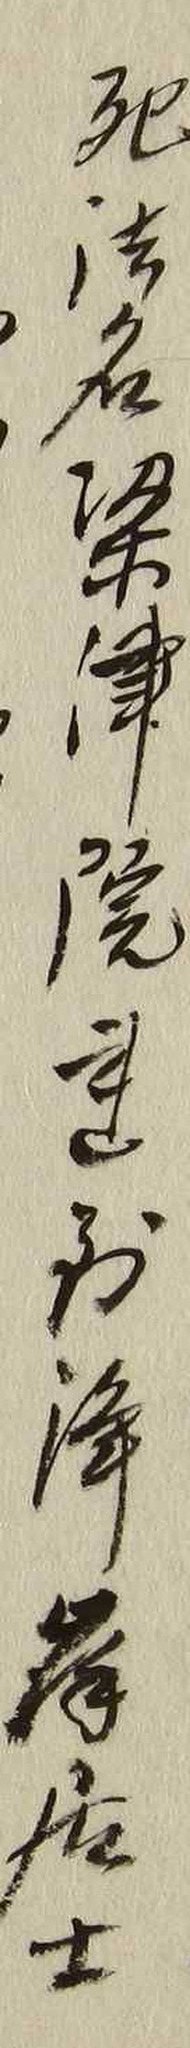死法名梁津院連到浄岸居士
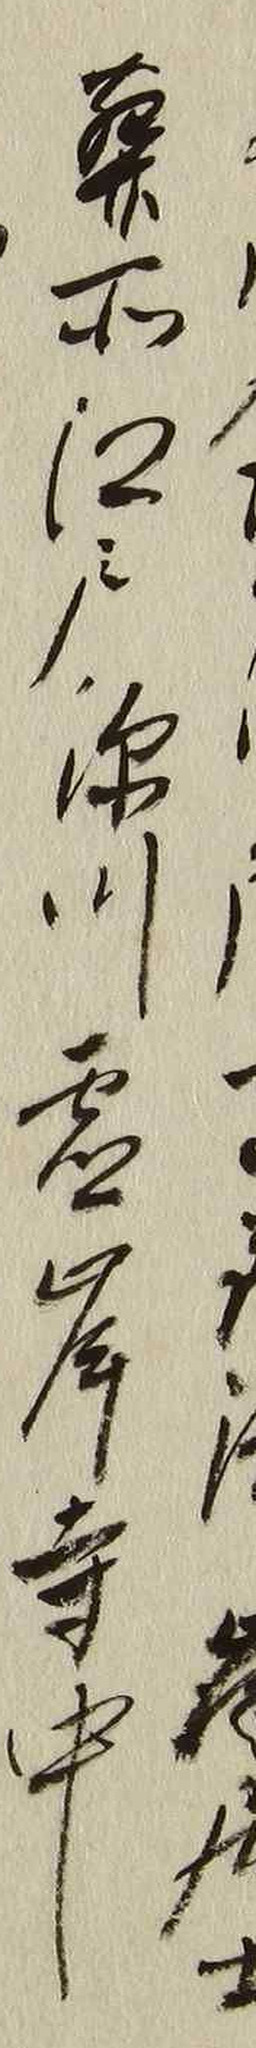葬所江戸深川霊岸寺中
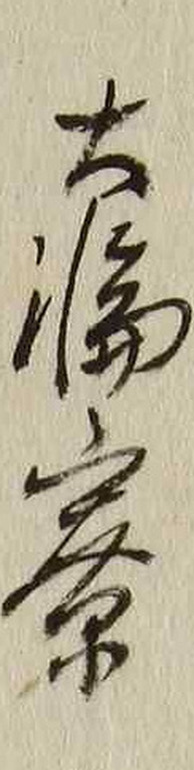大輪寮
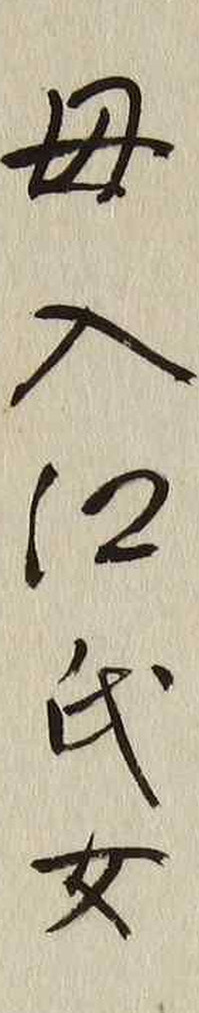母入江氏女
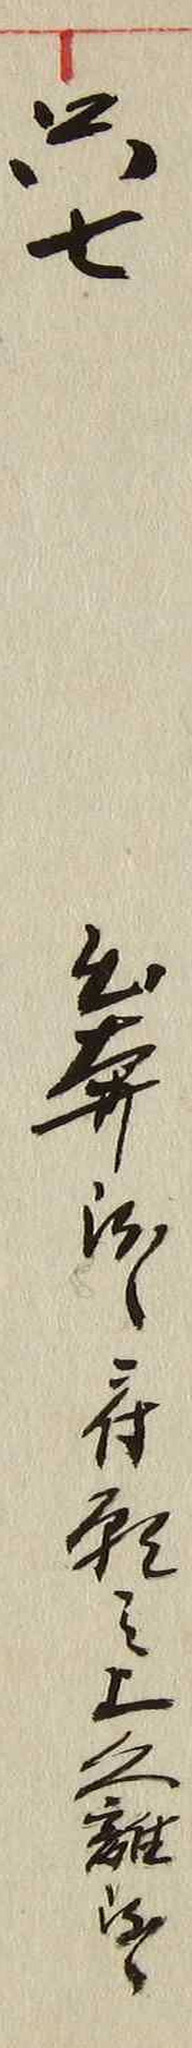只七出奔致候ニ付願之上久離致候
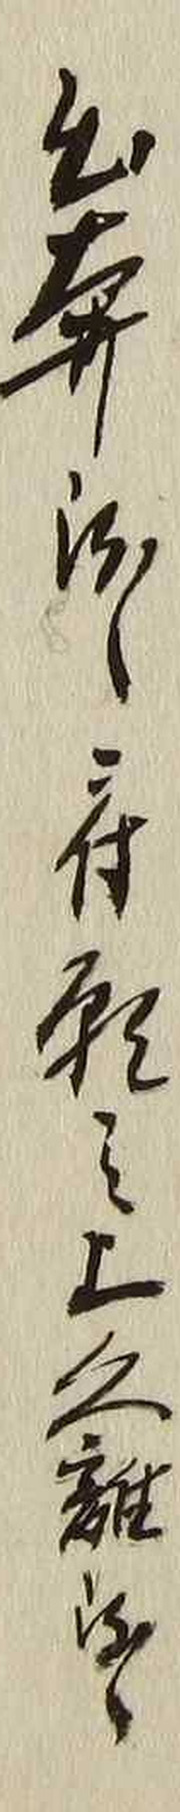只七出奔致候ニ付願之上久離致候
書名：諸士系譜　巻之349　も之部5
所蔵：会津若松市立会津図書館
